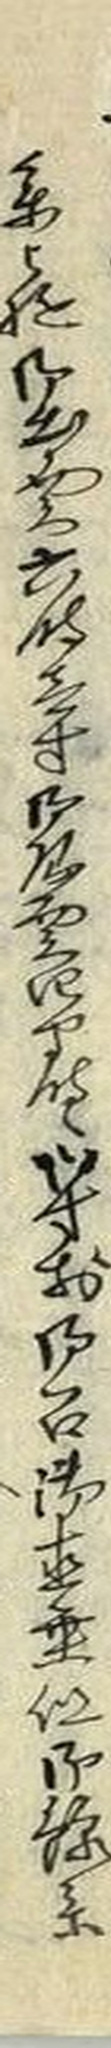参被遊御出殿六時壱寸御帰殿四半時へ弐寸前御召御直垂但御豫
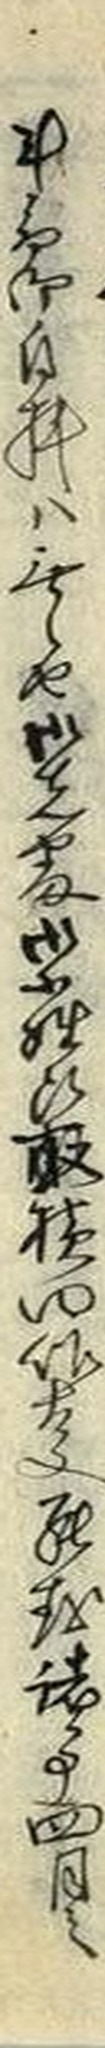参斗ニ而御自拝ハ無之候由御先番御小姓頭取横田作太夫罷越詰候事四月之
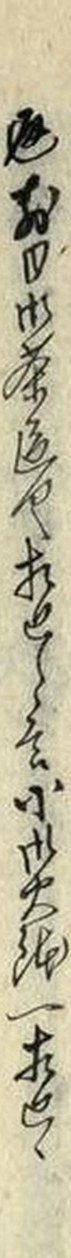通前日御茶道具相廻し候節ハ御火鉢一相廻候
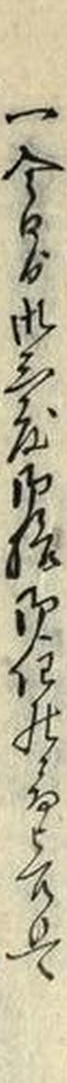一今日ゟ御三度御膳御住居ニ而被召上候
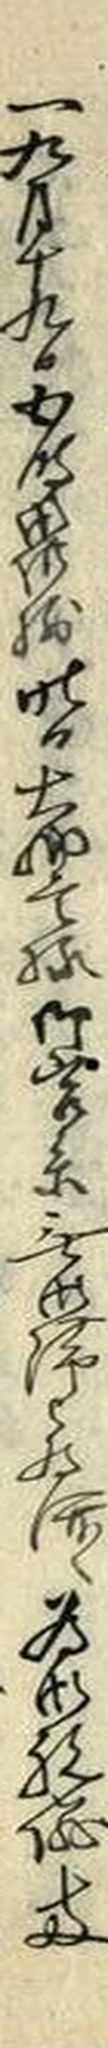一九月十九日五時御供揃昨日大納言様御宮参無御滞被為済候為御祝儀両
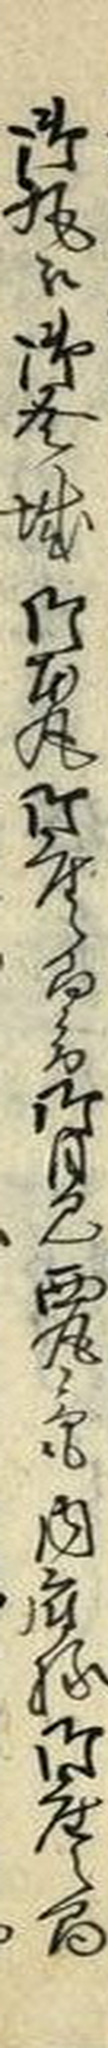御丸江御登城御本丸御座之間ニ而御目見西丸ニ而も内府様御座之間
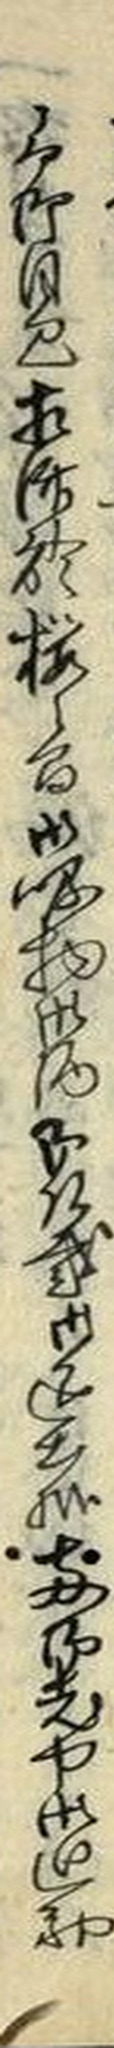ニ而御目見相済於桜之間御吸物御酒御頂戴御退出掛両御老中御廻勤

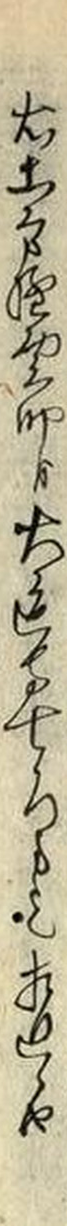右土方縫殿助ゟ大道寺七右衛門方迄相廻候由
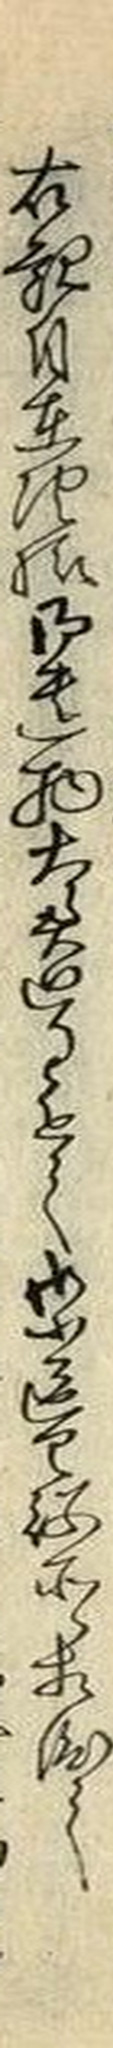右観月本院様御遺物大奥廻り被進之御小道具役所へ相渡之
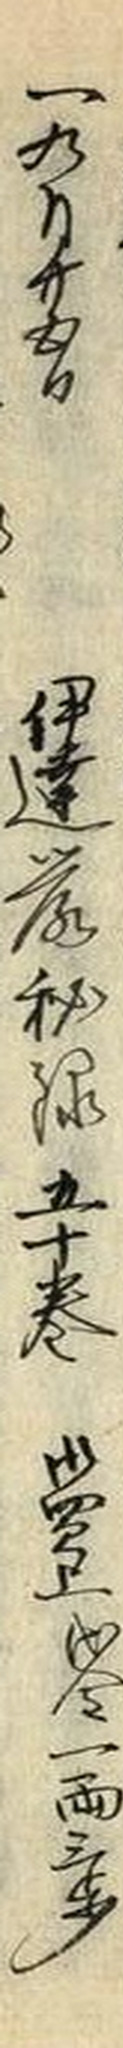一九月廿五日伊達厳秘録五十巻御買上代金一両三歩
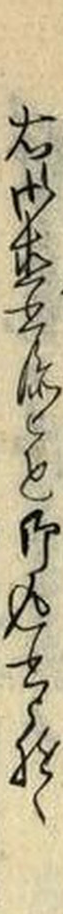右御直書添被進御返書被遊候
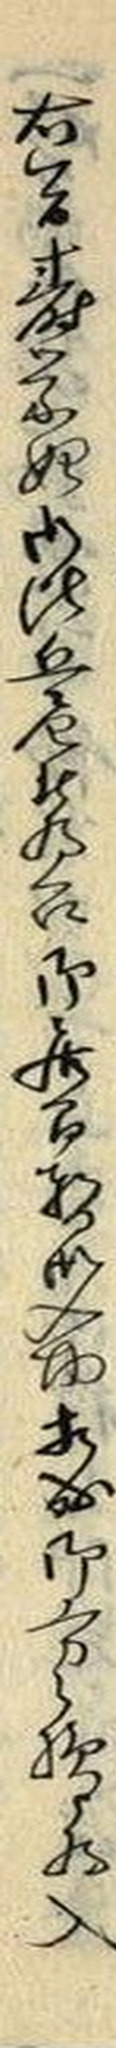右今日寿栄始御比丘尼被為召御居間暫御〆切相成御方々様被為入
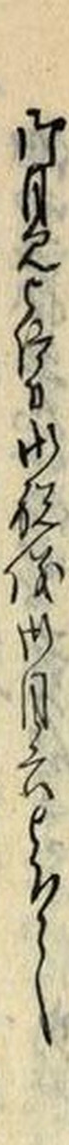御目見被仰付御祝儀御目六被下
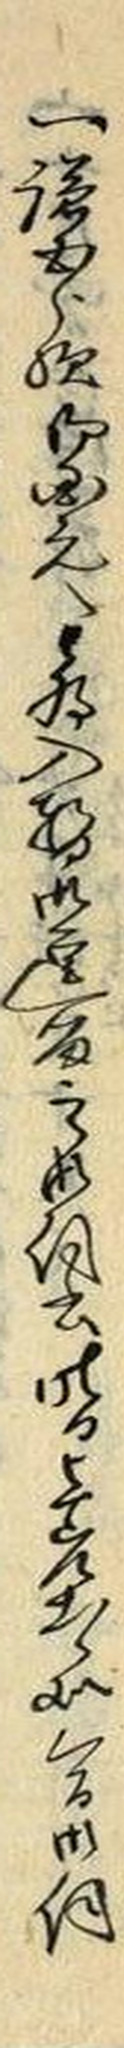一謙五郎様御国元へ被為入暫御逗留之御伺書昨日被差出候処今日御伺
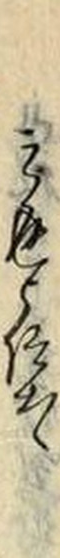之通被仰出候
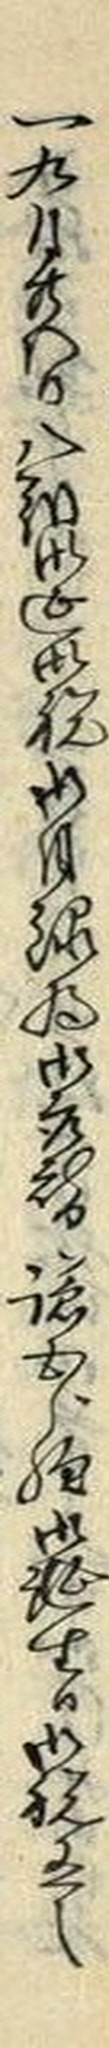一九月廿八日八朔御延御祝御目録為御取替謙五郎御誕生日御祝有之
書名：少傅日録抄（斉承付側向頭取日記、在府）
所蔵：福井県文書館 Fukui Prefectural Archives
